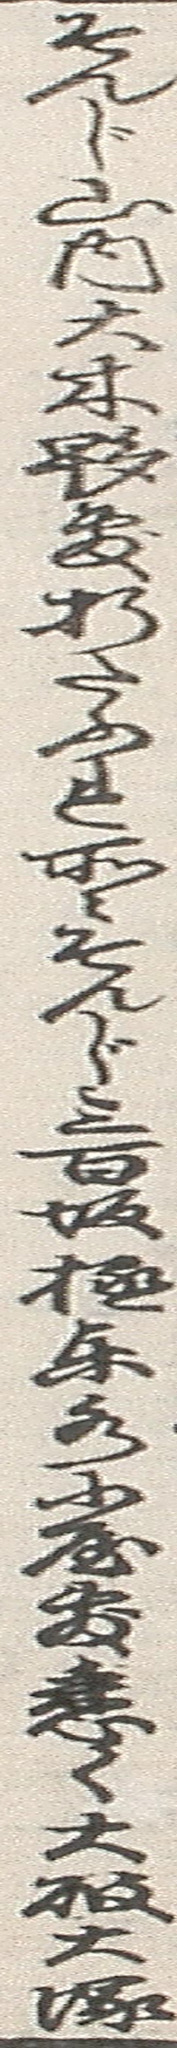そんじ山門大木夥敷折たふれ所々そんじ三百坂極楽水小屋敷悉く大破大塚
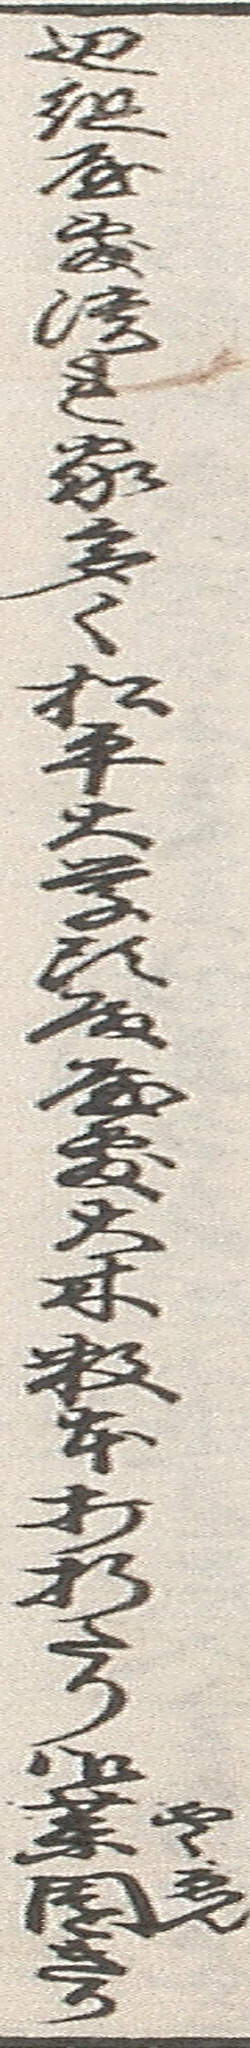辺組屋敷潰れ家多く松平大学頭殿屋敷大木数本打折たり御薬園きり
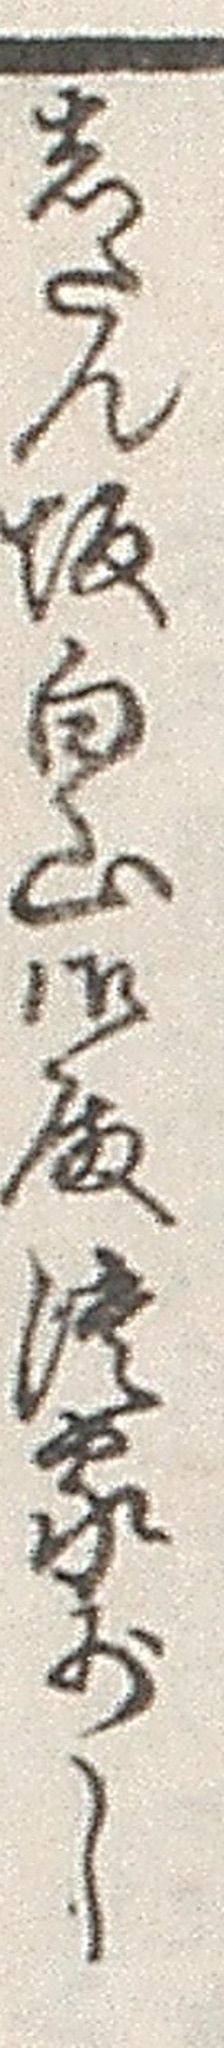したん坂白山御殿潰家少し
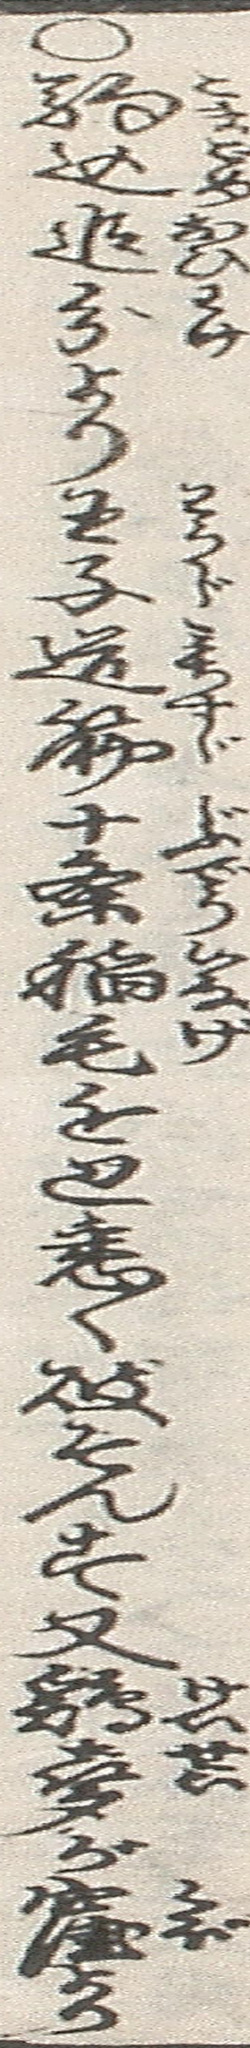◯駒込追分より王子道筋十条稲毛近辺悉く破そんす又鶏声が窪より
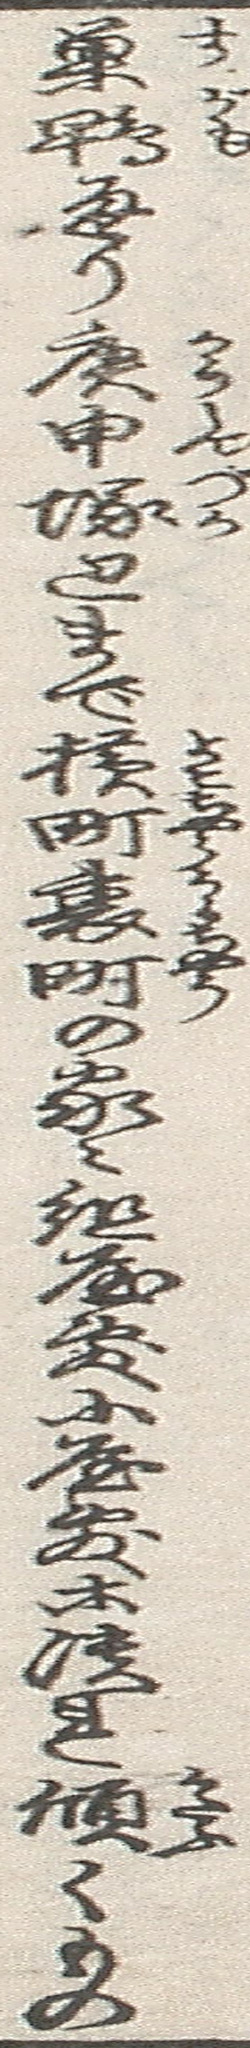巣鴨通り庚申塚辺まで横町裏町の家々組屋敷小屋敷等潰れ傾くもの
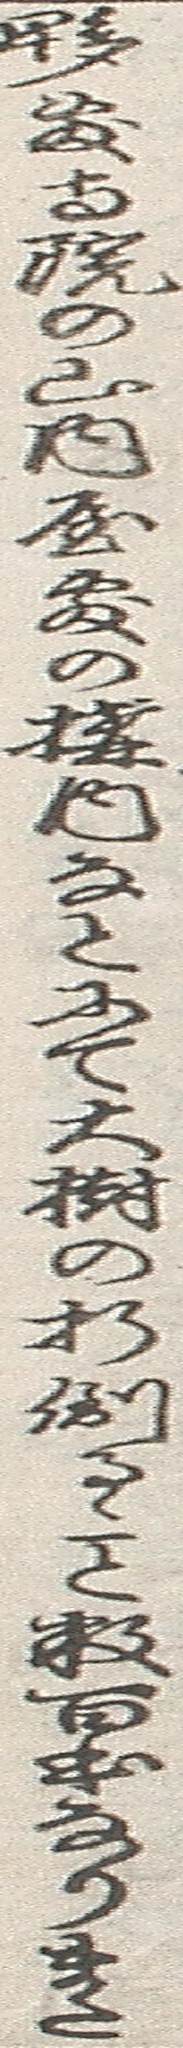夥敷寺院の山内屋敷の構内なとにて大樹の折倒るゝこと数百本なりまた
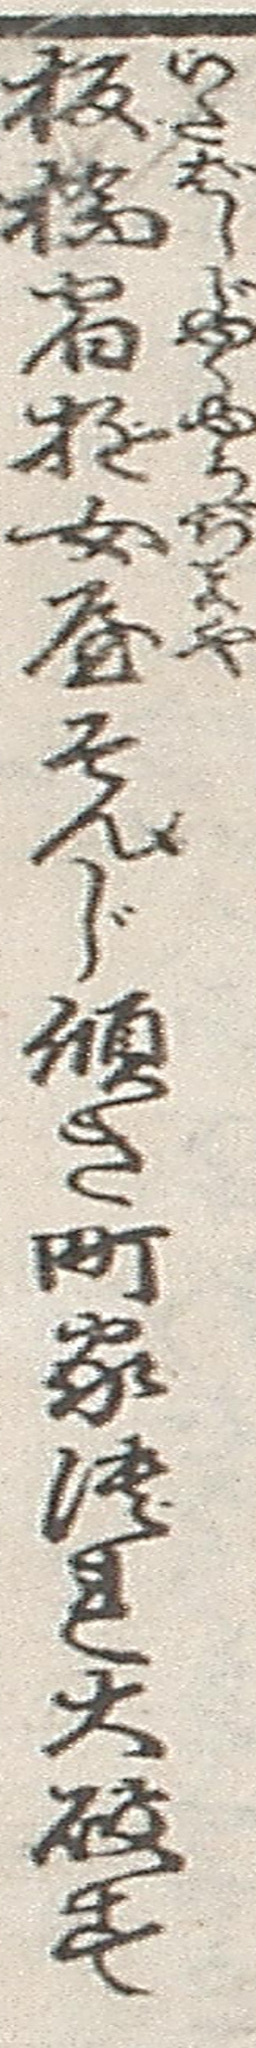板橋宿遊女屋そんじ傾き町家潰れ大破す
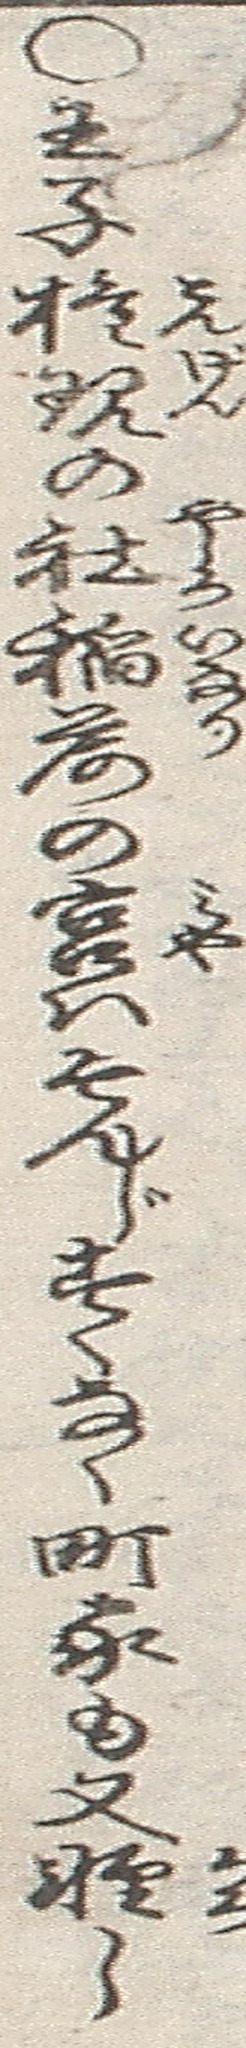◯王子権現の社稲荷の宮ハそんじすくなく町家も又軽し
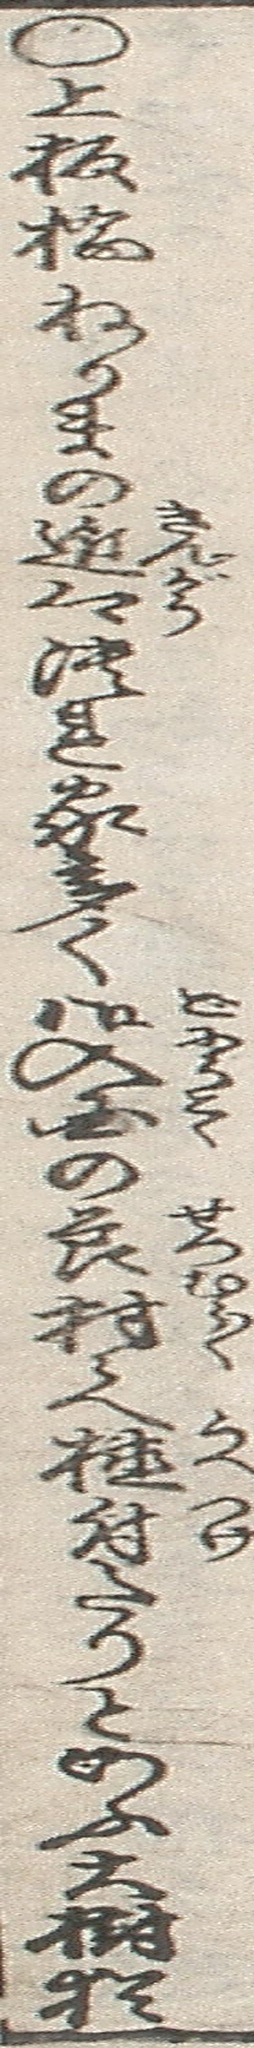◯上板橋ねりまの近郷潰れ家多く御入国の節村々へ植付たりと給ふ大樹猶

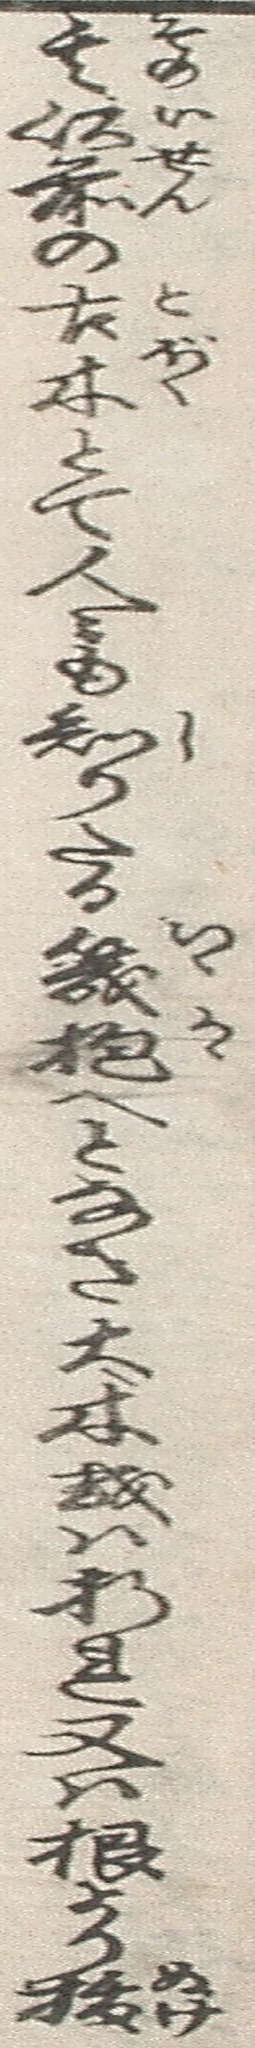其以前の古木とて人二も知りたる幾抱へとなき大木或ハ折れ又ハ根より抜
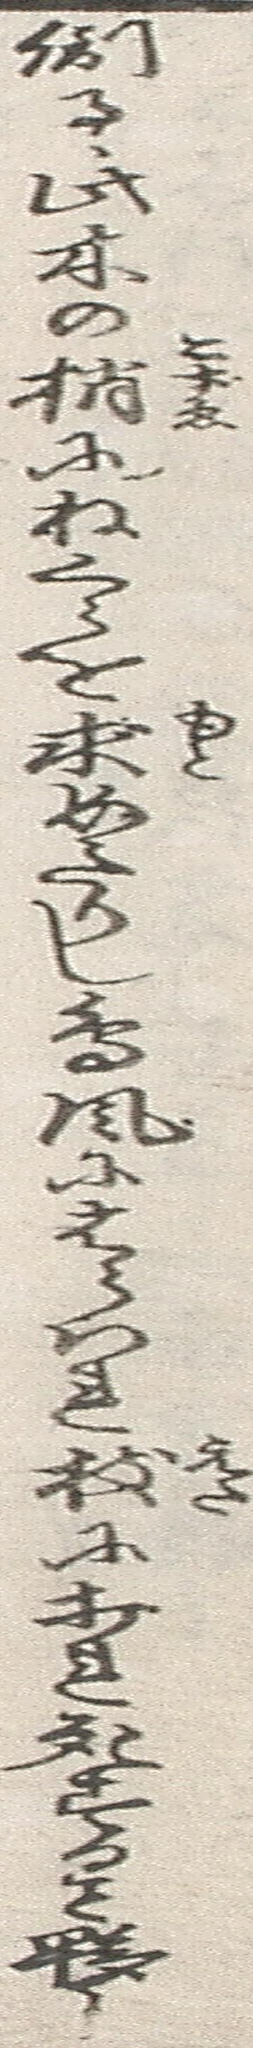倒る此木の梢にねくらを求めたりし鳥風にはらハれ枝におれ死すること夥し
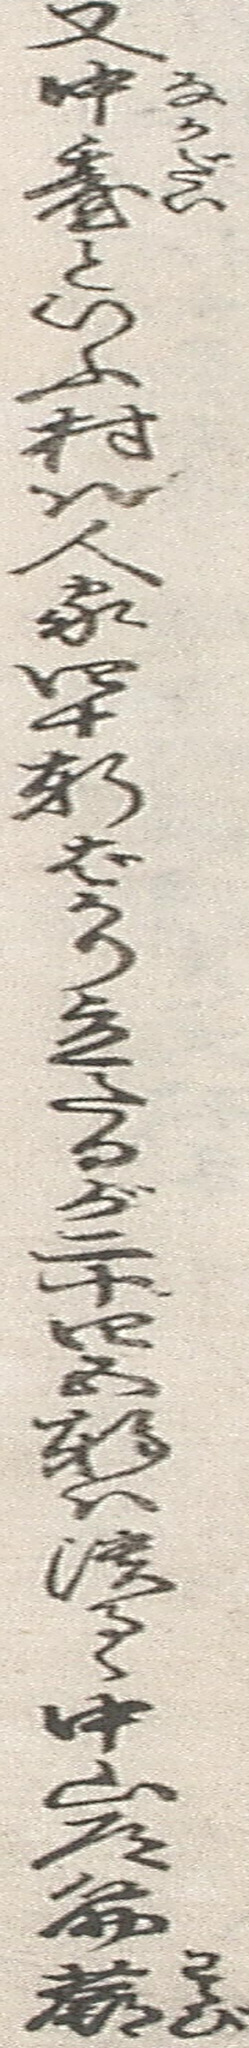又中台といふ村ハ人家四十軒ばかり立たるが二十四五軒ハ潰るゝ中山道筋蕨
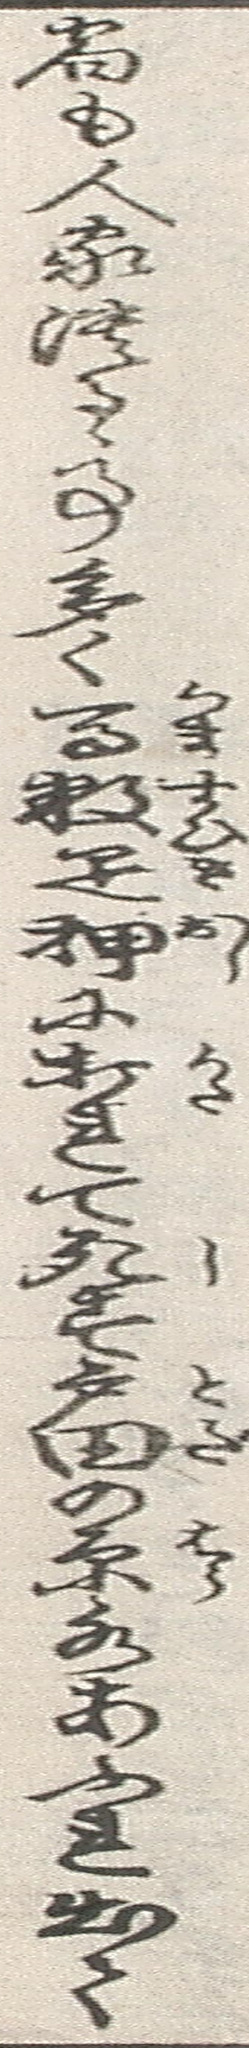宿も人家潰るゝ事多く馬数疋押に打れて死す戸田の原水あふれ出て
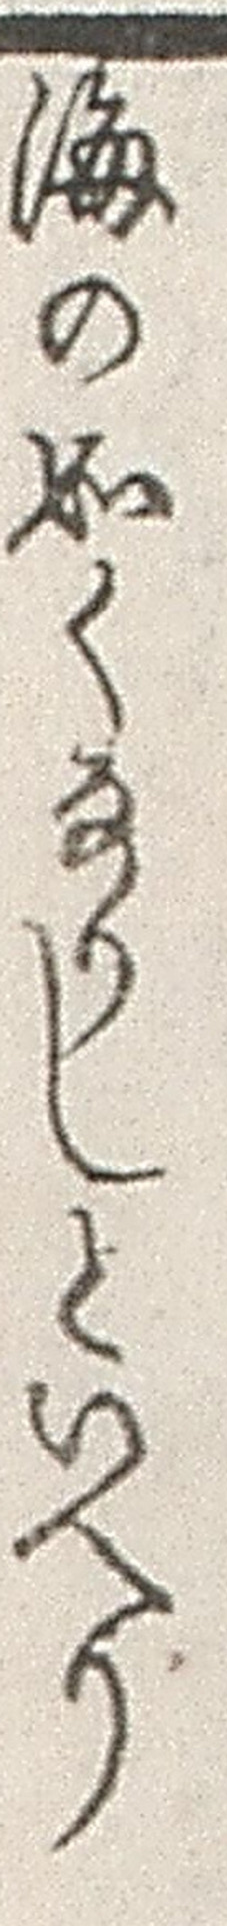海の如くなりしといへり
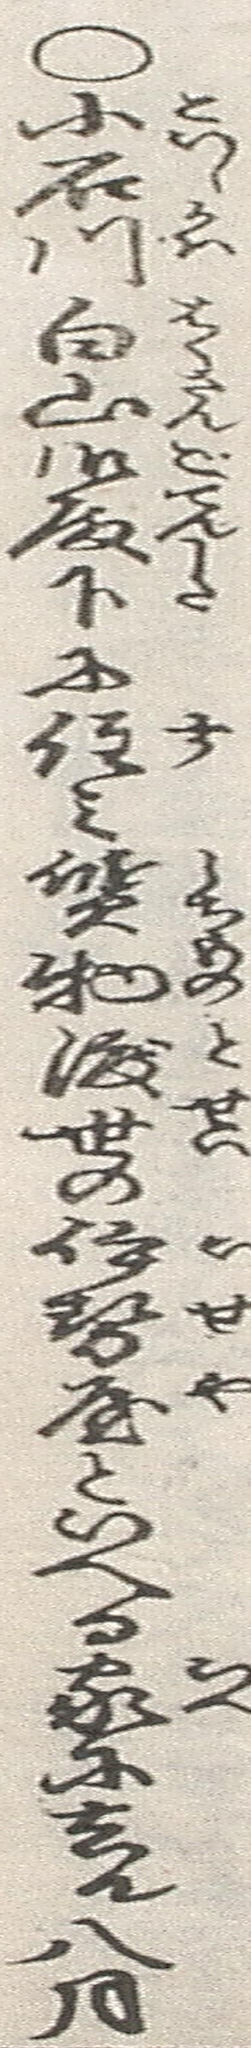◯小石川白山御殿下に住ミ質物渡世の伊勢屋といへる家に去ㇽ八月
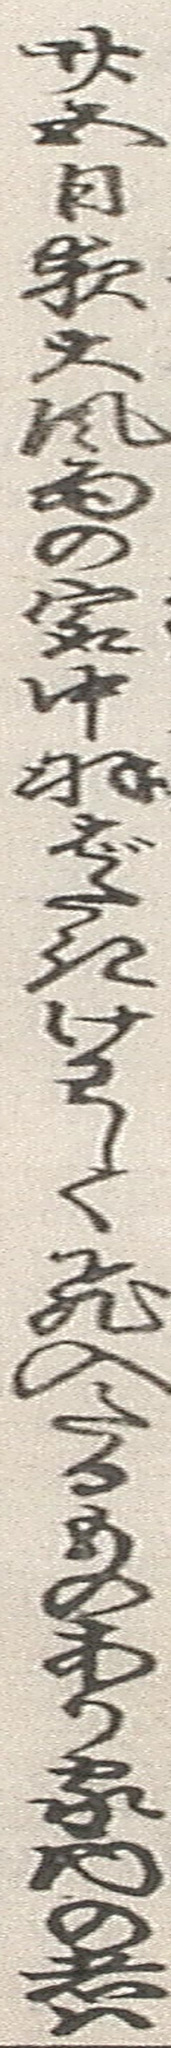廿五日夜大風雨の最中羽ばたけけわしく飛入たるものあり家内の者ハ
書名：安政風聞集　上中下　全
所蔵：東京大学地震研究所図書室 Earthquake Research Institute Library, The University of Tokyo, JAPAN
